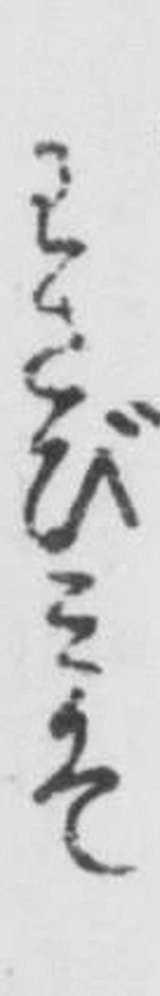わさびみそ
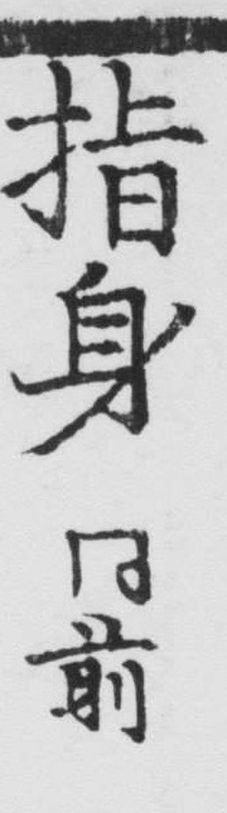指身同前
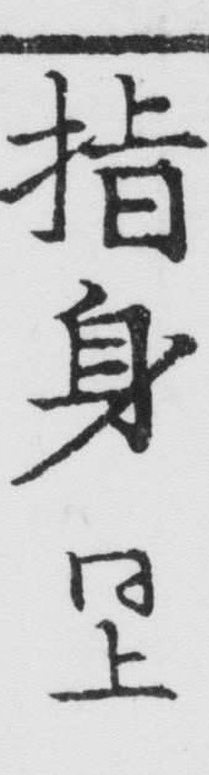指身同上
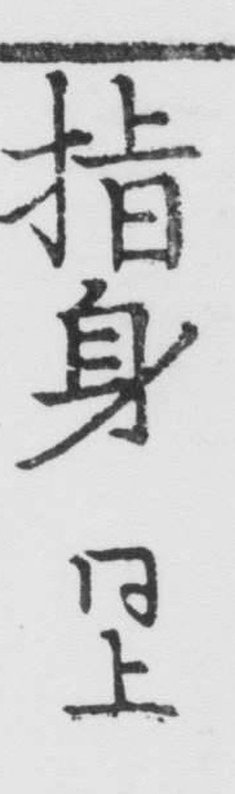指身同上
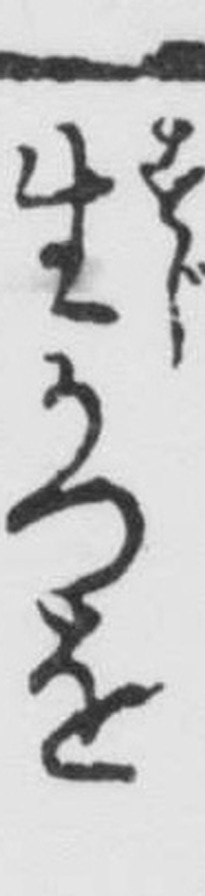生かつを
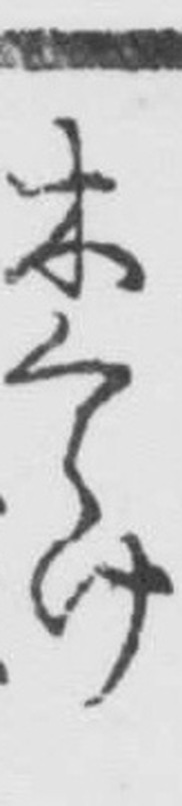木くらけ
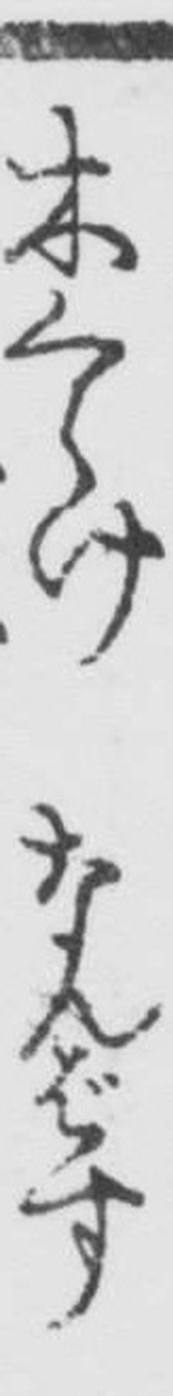木くらけわさびす
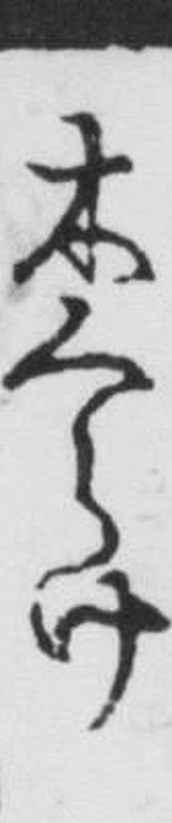木くらけ
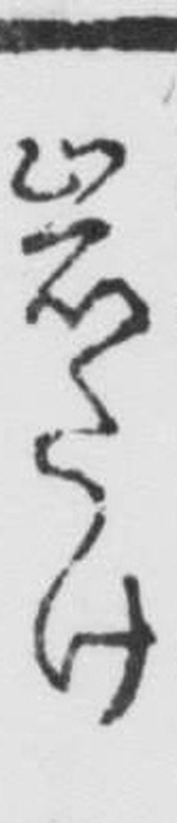岩たけ
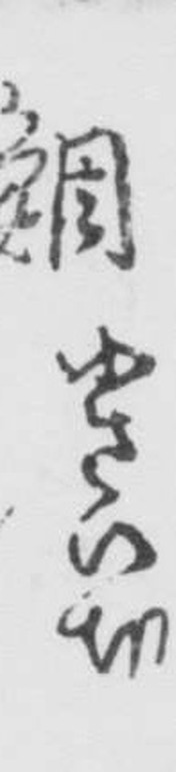鯛小さい切
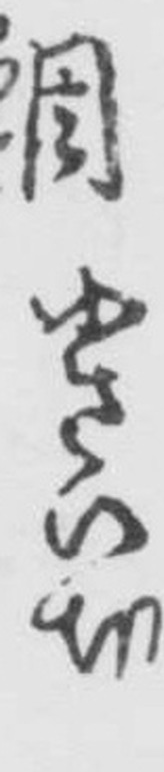鯛小さい切
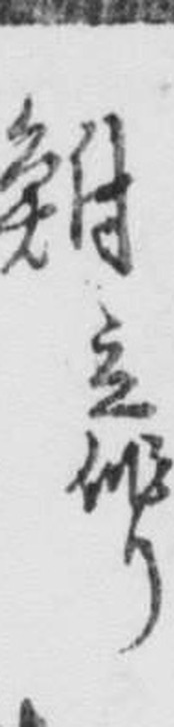鮒立作り
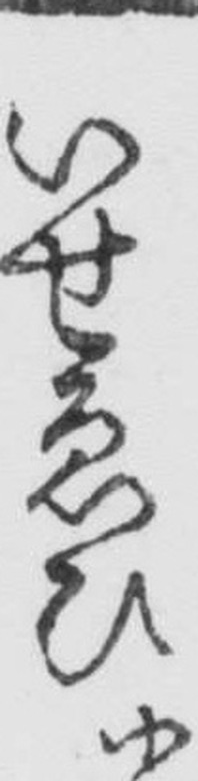いせゑび
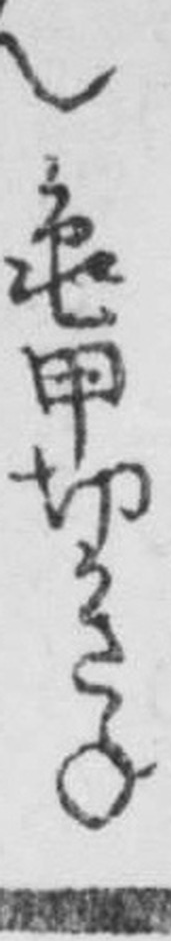大根亀甲切かさね
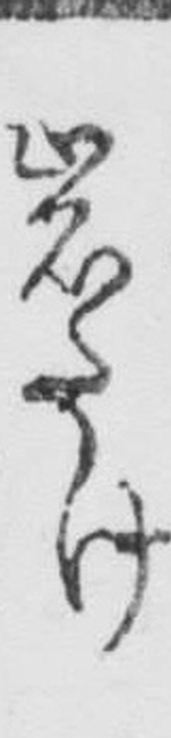岩たけ
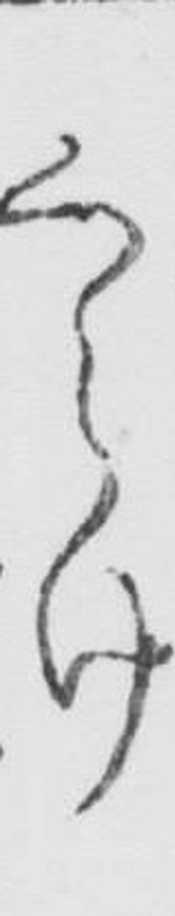くらけ
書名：諸家通用/即席料理
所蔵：大阪府立大学学術情報センター 国文学研究資料館
